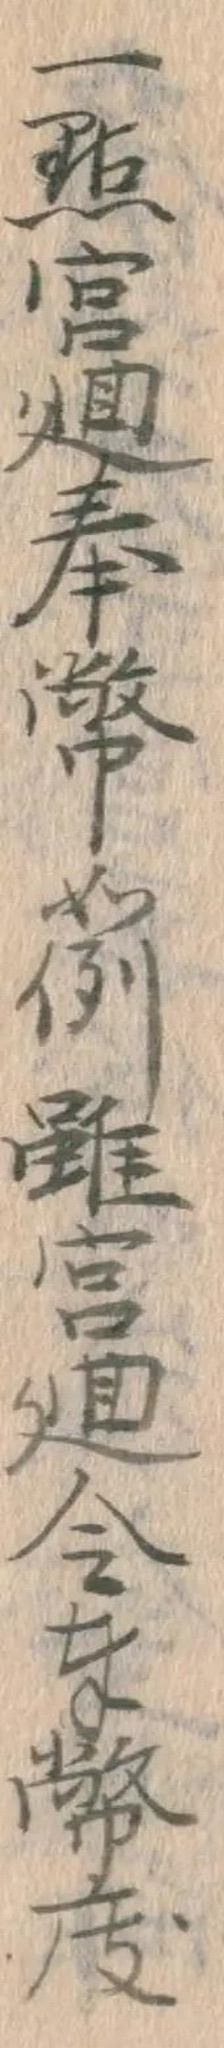一点宮廻奉幣如例雖宮廻令奉幣度
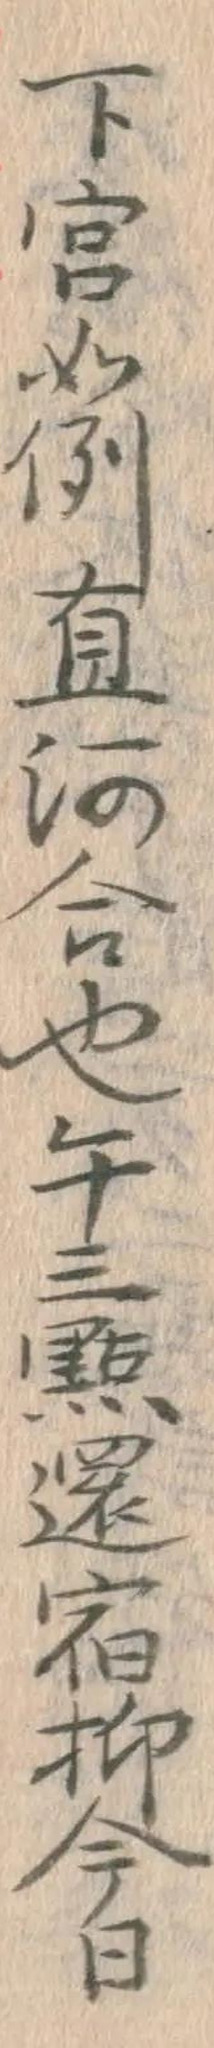下宮如例直河合也午三点還宿抑今日
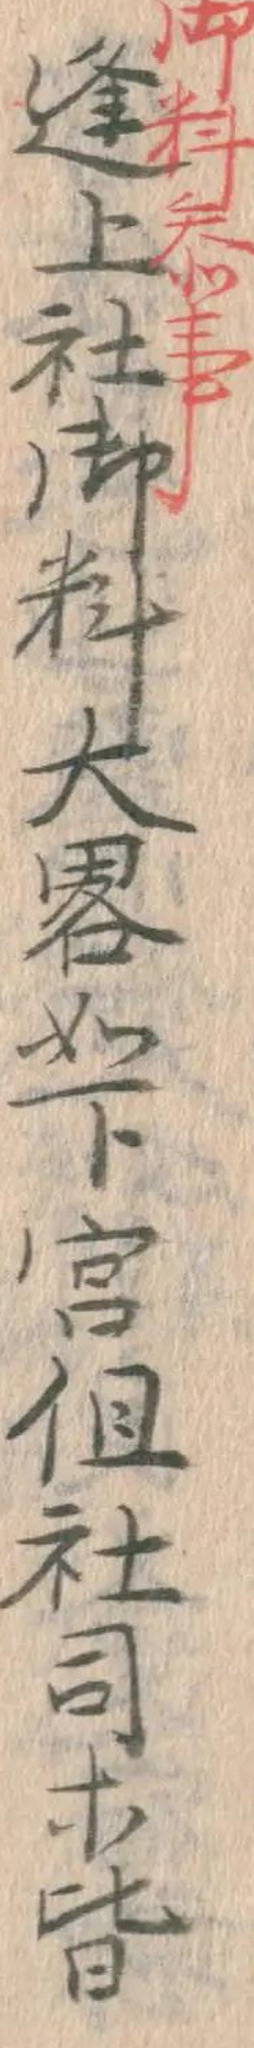逢上社御料大略如下宮但社司等皆
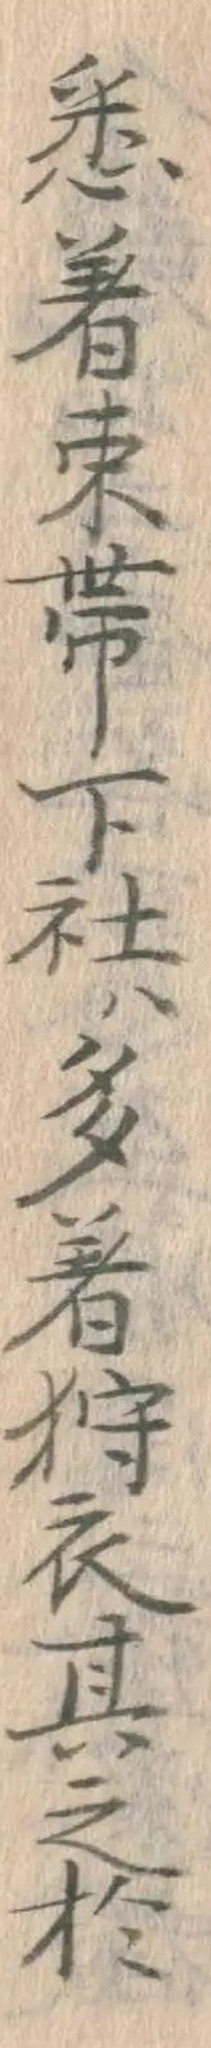悉着束帯下社ハ多着狩衣其之於
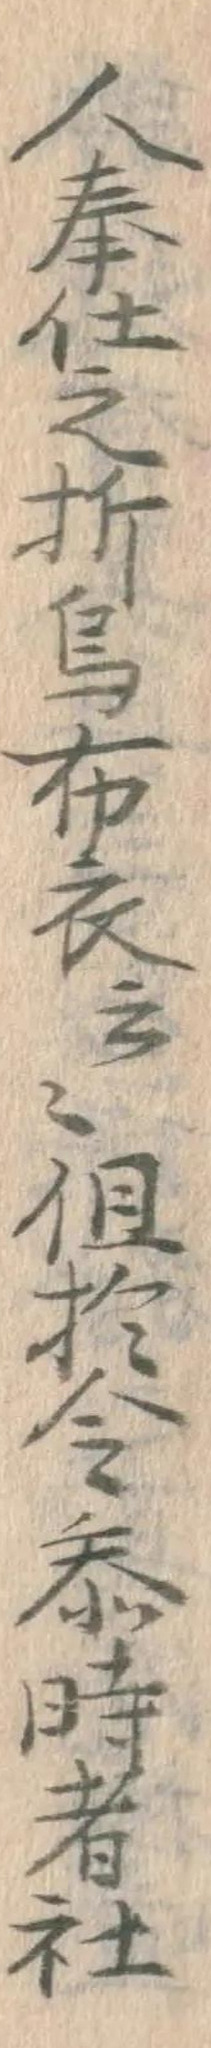人奉仕之折烏布衣云々但於令参時者社
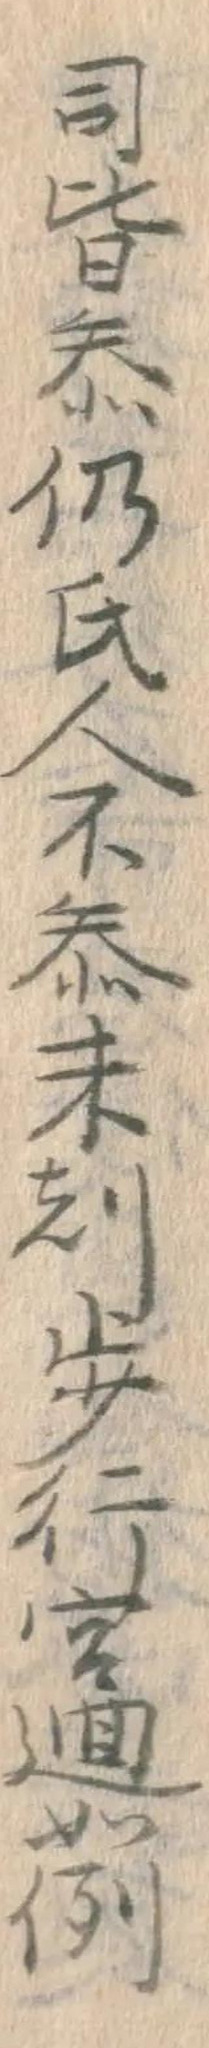司皆参仍氏人不参未刻歩行宮廻如例
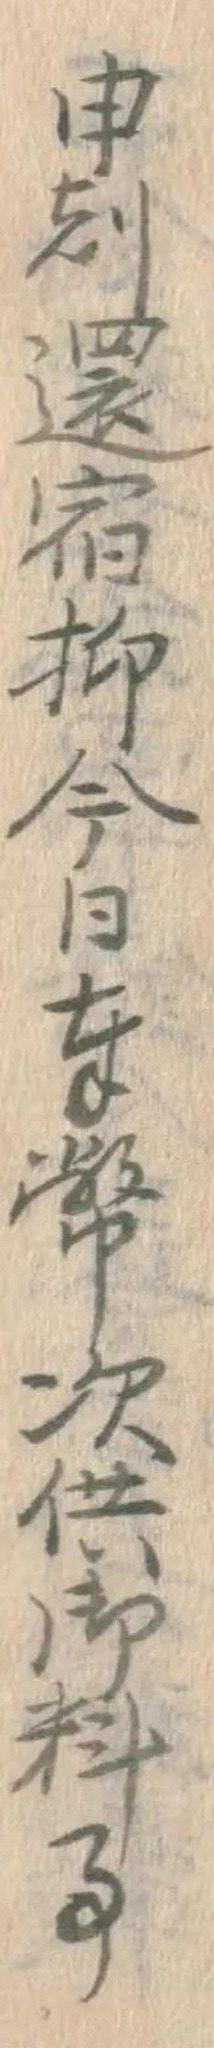申刻還宿抑今日奉幣次供御料事
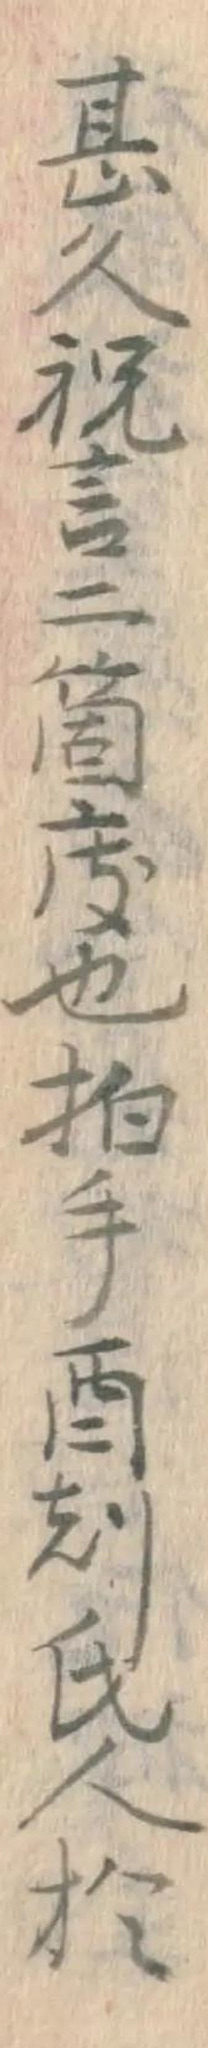甚久祝言二箇度也拍手酉刻氏人於

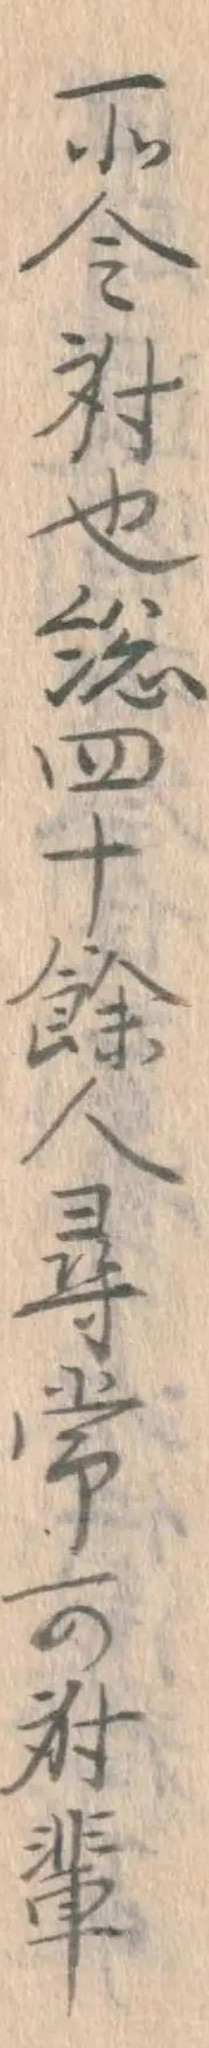所令射也総四十余人尋常可射輩
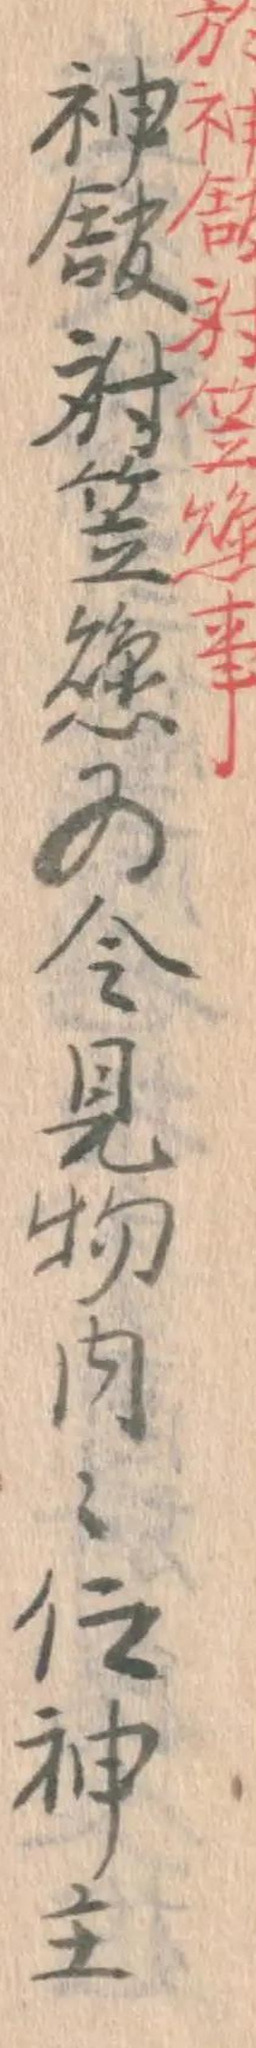神館射笠懸為令見物内々仰神主
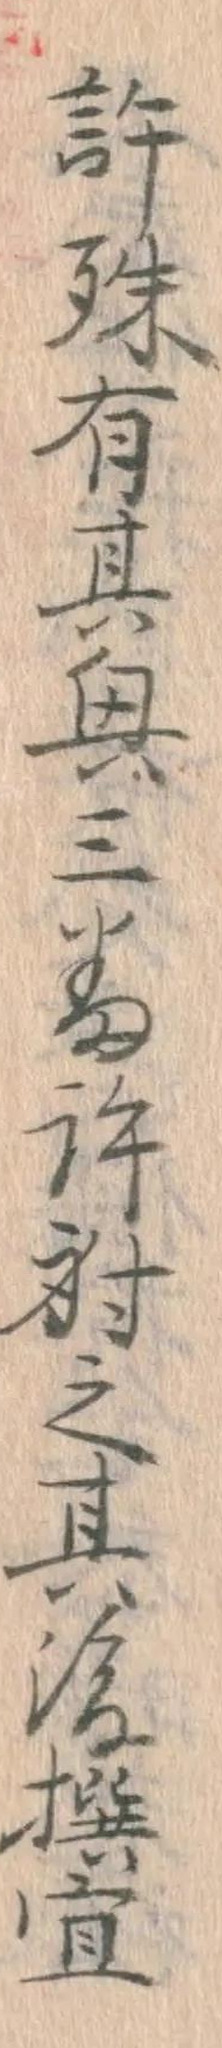許殊有其興三番許射之其後撰宜
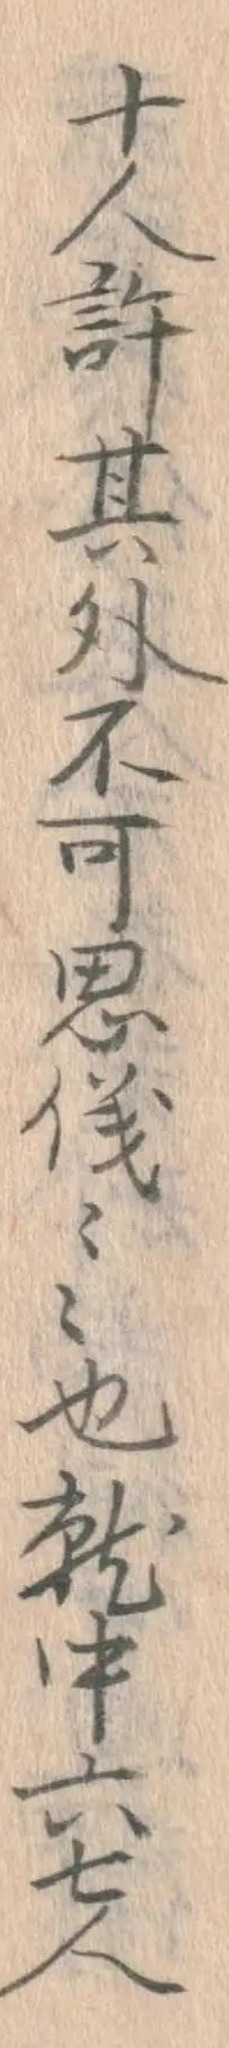十人許其外不可思儀云々也就中六七人
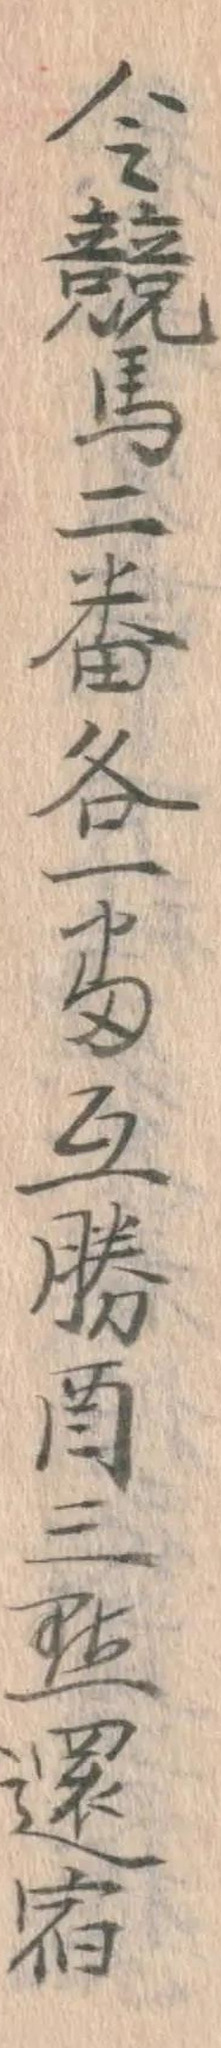令競馬二番各一番互勝酉三点還宿
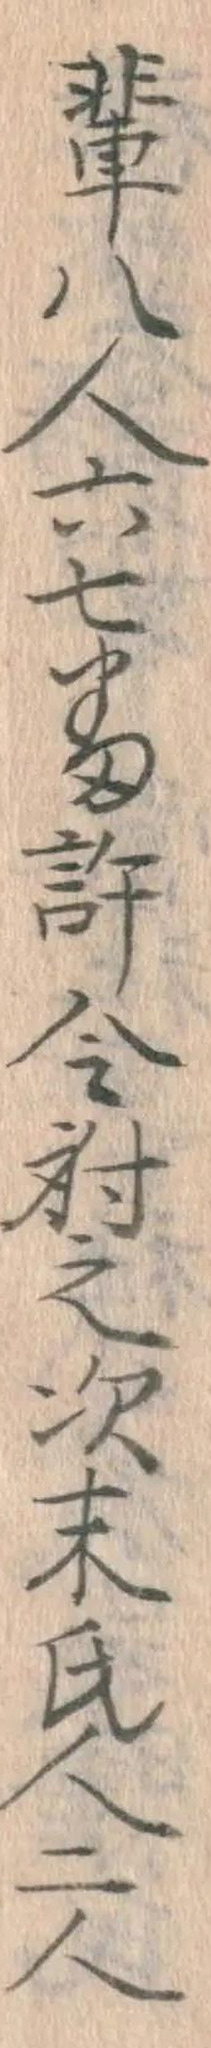輩八人六七番許令射之次末氏人二人
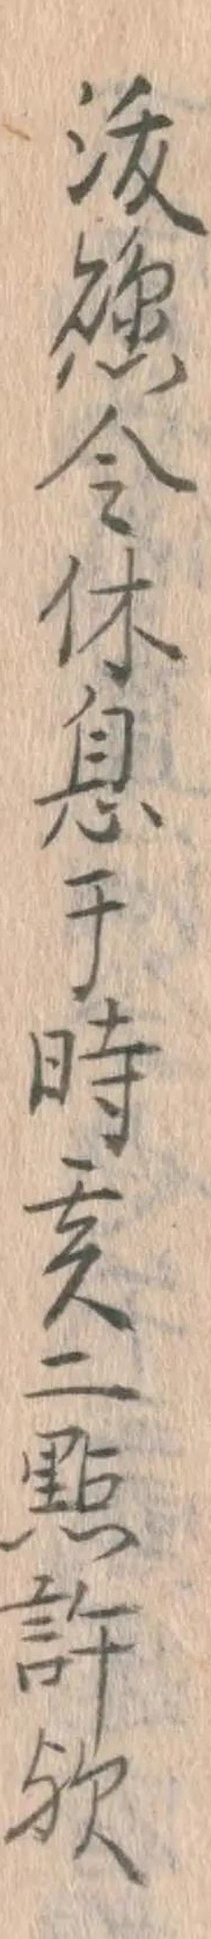沃懸令休息于時亥二点許歟
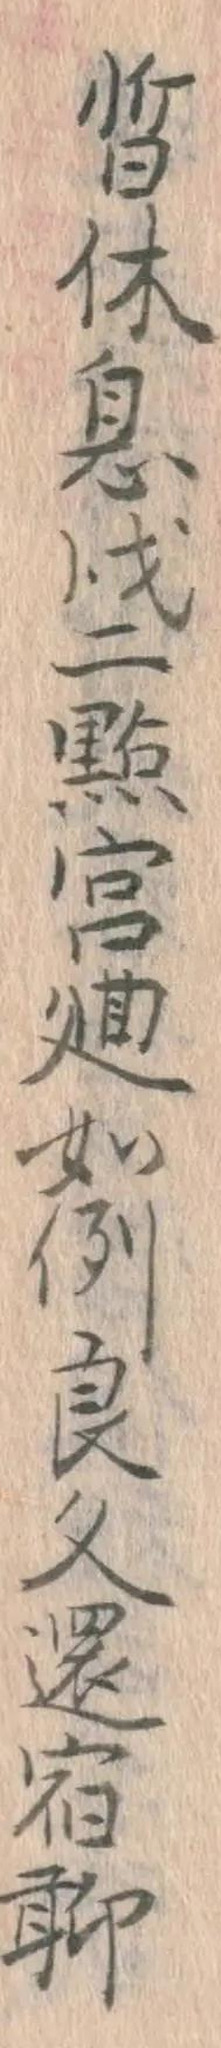暫休息戌二点宮廻如例良久還宿聊
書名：賀茂社記録. 第80冊
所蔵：国立国会図書館 National Diet Library, JAPAN
